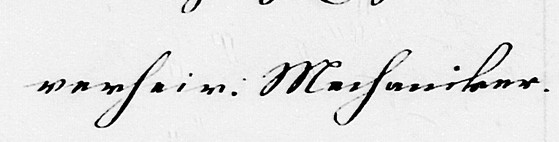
verheir. Mechaniker.
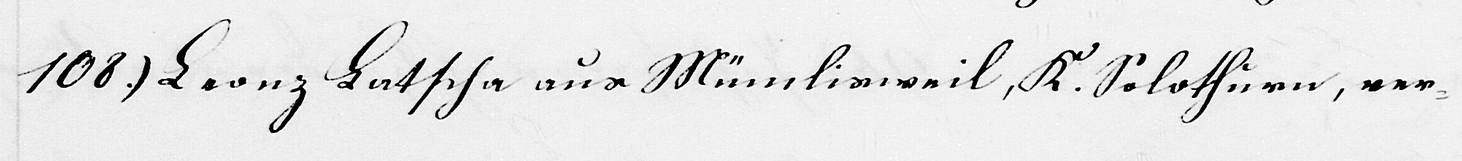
108.) Leonz Latscha aus Mümlisweil, K. Solothurn, ver¬
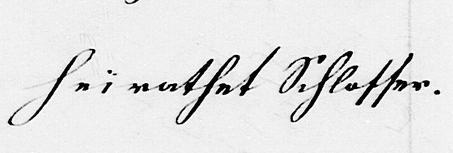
heirathet Schlosser.
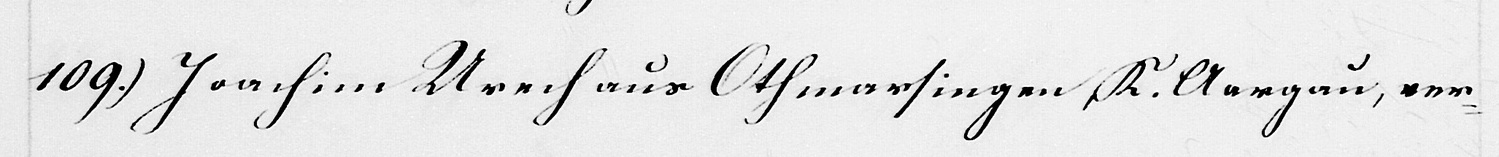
109.) Joachim Urech aus Othmarsingen, K. Aargau, ver¬
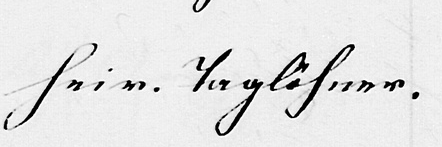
heir. Taglöhner.
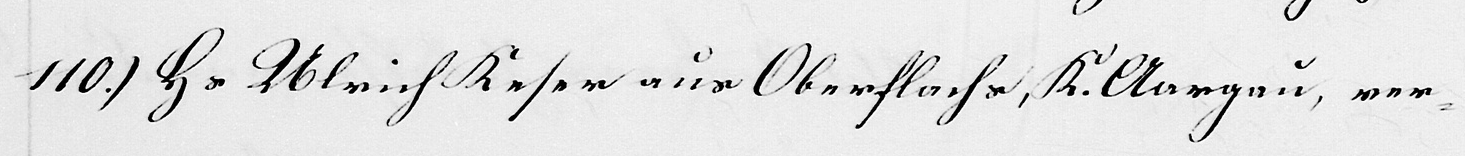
110.) Hs Ulrich Keser aus Oberflachs, K. Aargau, ver¬
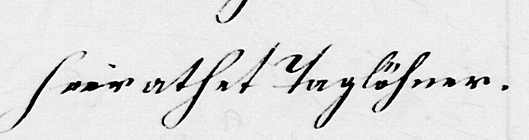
heirathet Taglöhner.
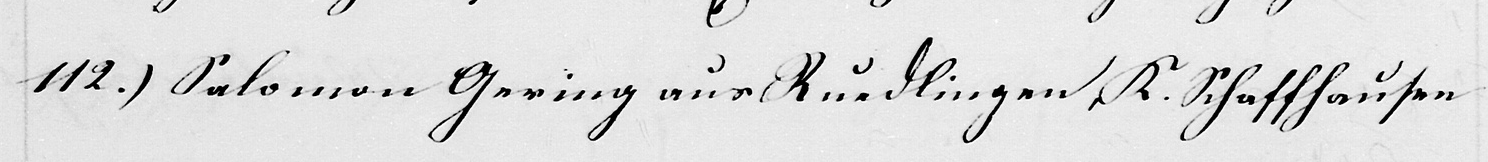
112.) Salomon Gering aus Ruedlingen, K. Schaffhausen
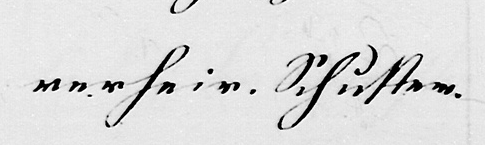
verheir. Schuster.
